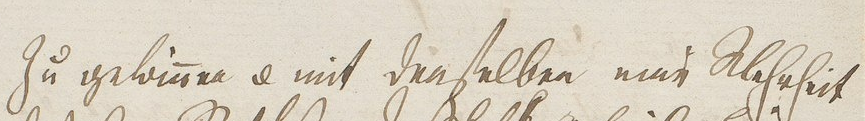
zu gewinnen & mit denselben eine Mehrheit
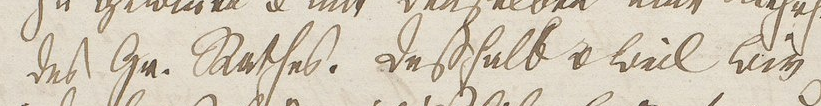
des Gr. Rathes. Deßhalb & weil wir
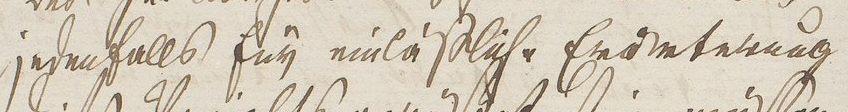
jedenfalls für einläßliche Erörterung
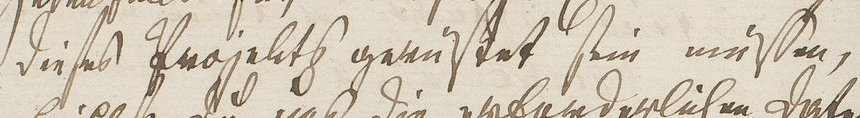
dieses Projekts gerüstet sein müssen,
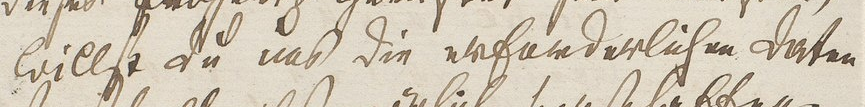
willst Du uns die erforderlichen Daten
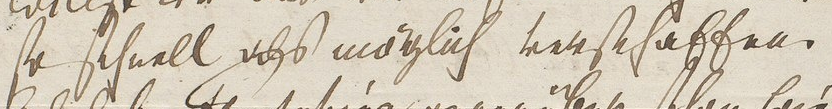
so schnell als möglich verschaffen.
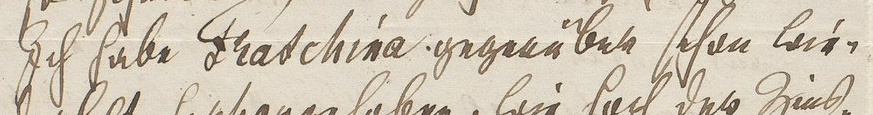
Ich habe Fraschina gegenüber schon wie-
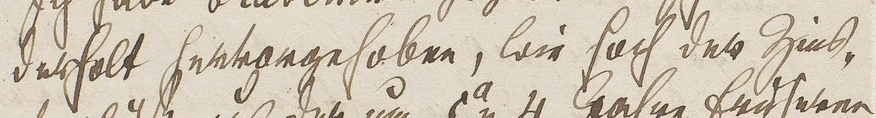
derholt hervorgehoben, wie hoch der Zins-
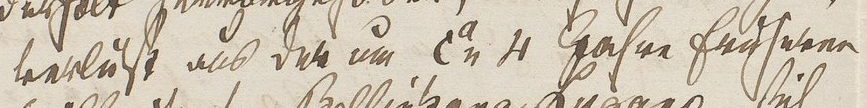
verlust aus der um ca 4 Jahre früheren
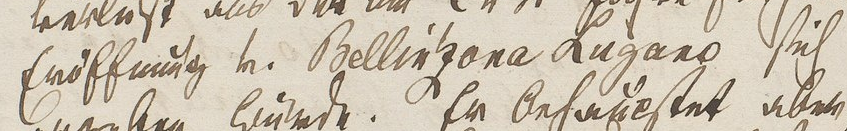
Eröffnung v. BellinzonaLugano sich
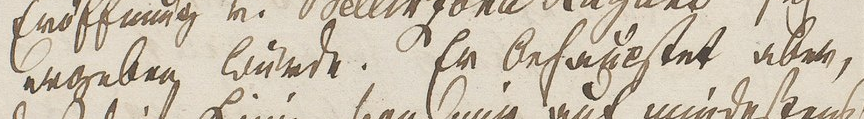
ergeben würde. Er behauptet aber,
